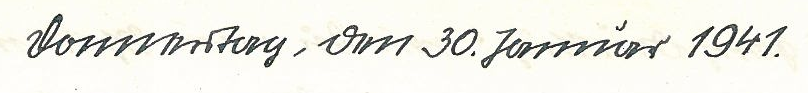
Donnerstag, den 30. Januar 1941.
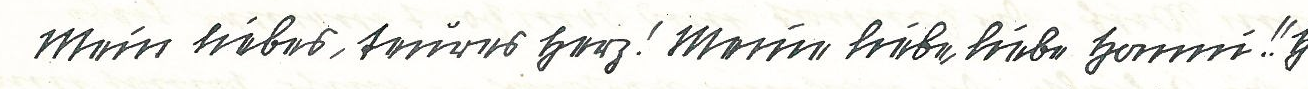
Mein liebes, teures Herz! Meine liebe, liebe !
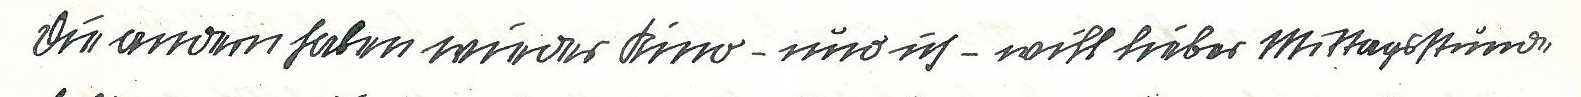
Die andern haben wieder Kino – und ich – will lieber Mittagsstunde
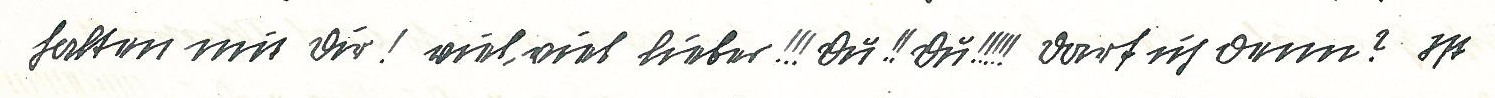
halten mit Dir! Viel, viel lieber!!! Du!! Du!!!!! Darf ich denn? Ist
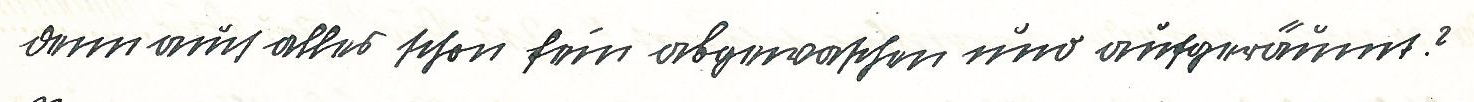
denn auch alles schon fein abgewaschen und aufgeräumt?
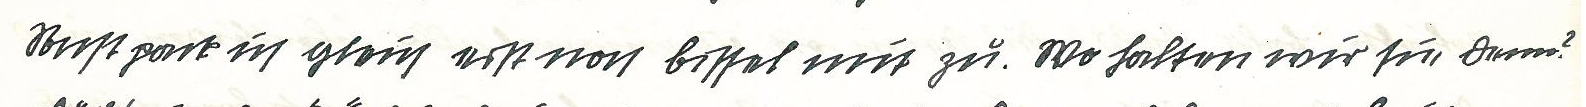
Sonst pack ich gleich erst noch bissel mit zu. Wo halten wir sie denn?
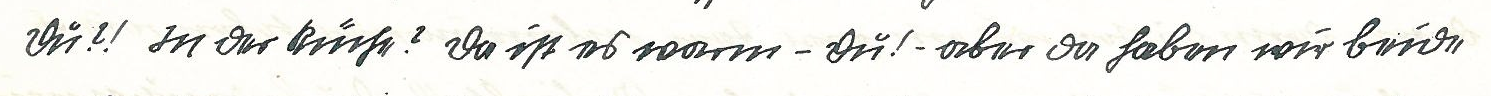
Du?! In der Küche? Da ist es warm – Du! – aber da haben wir beide
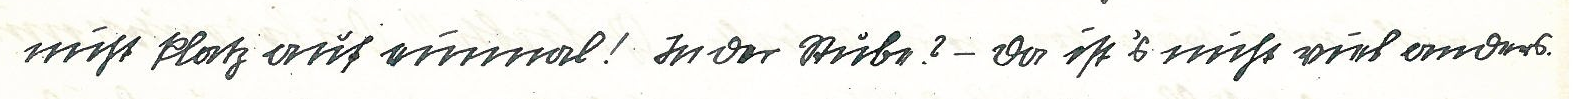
nicht Platz auf einmal! In der Stube? – da ist’s nicht viel anders.
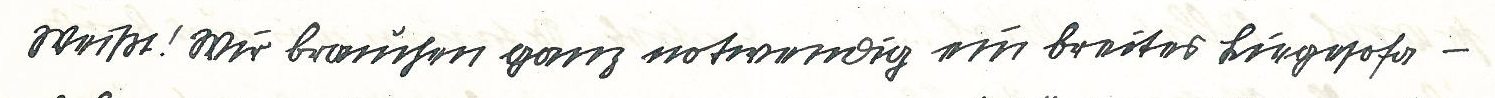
Weißt Wir brauchen ganz notwendig ein breites Liegesofa –
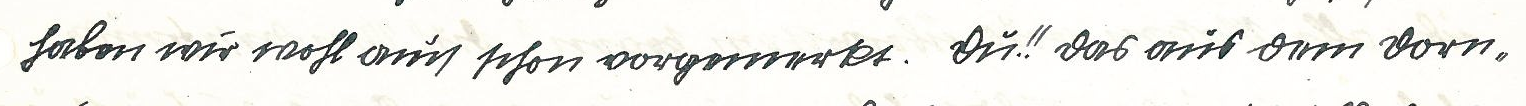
haben wir auch wohl schon vorgemerkt. Du!! Das aus dem Dorn¬
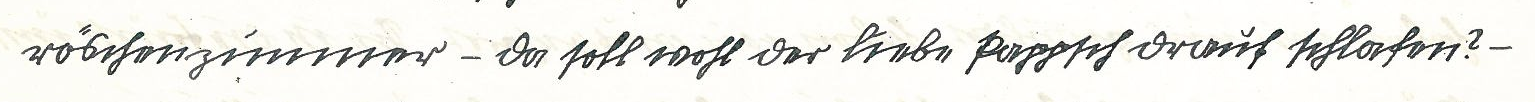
röschenzimmer – da soll wohl der liebe Pappsch drauf schlafen? –
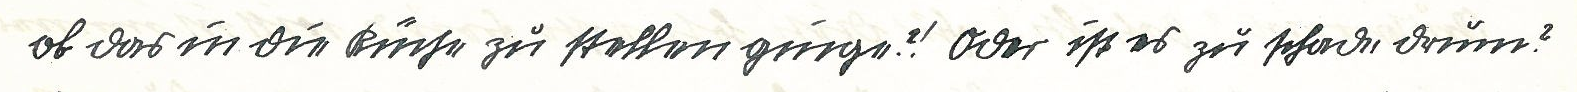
ob das in die Küche zu stellen ginge?! Oder ist es zu schade drum?
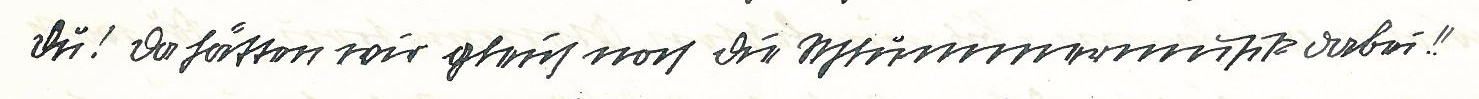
Du! Da hätten wir gleich noch die Schlummermusik dabei!!
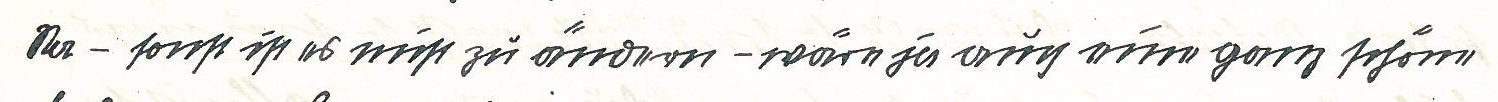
Na – sonst ist es nicht zu ändern – wäre ja auch eine ganz schöne
